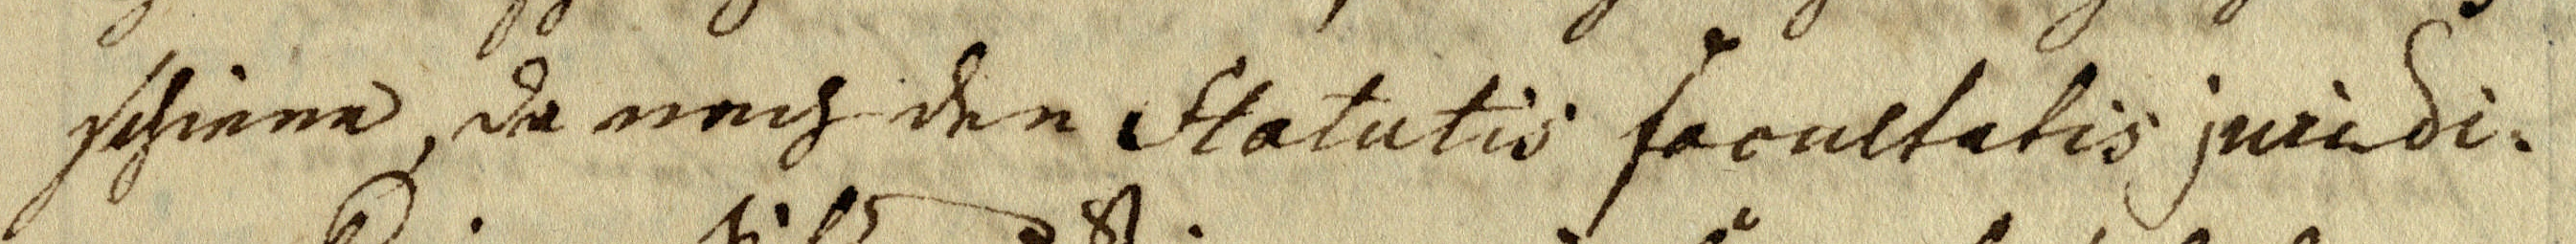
scheine, da nach den Statutis facultatis juridi¬
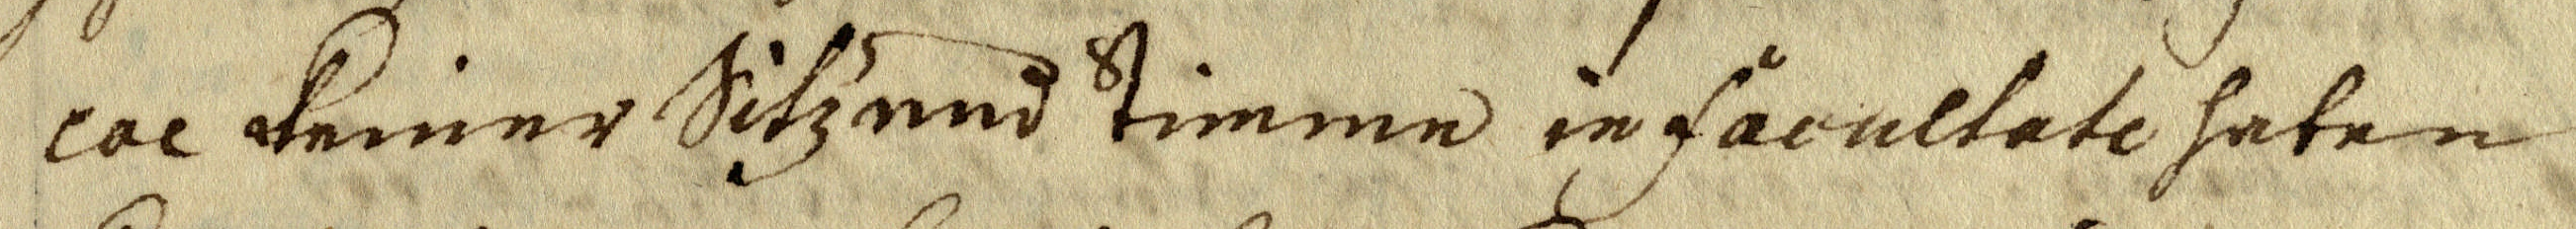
cae keiner Sitz und Stimme in facultate haben
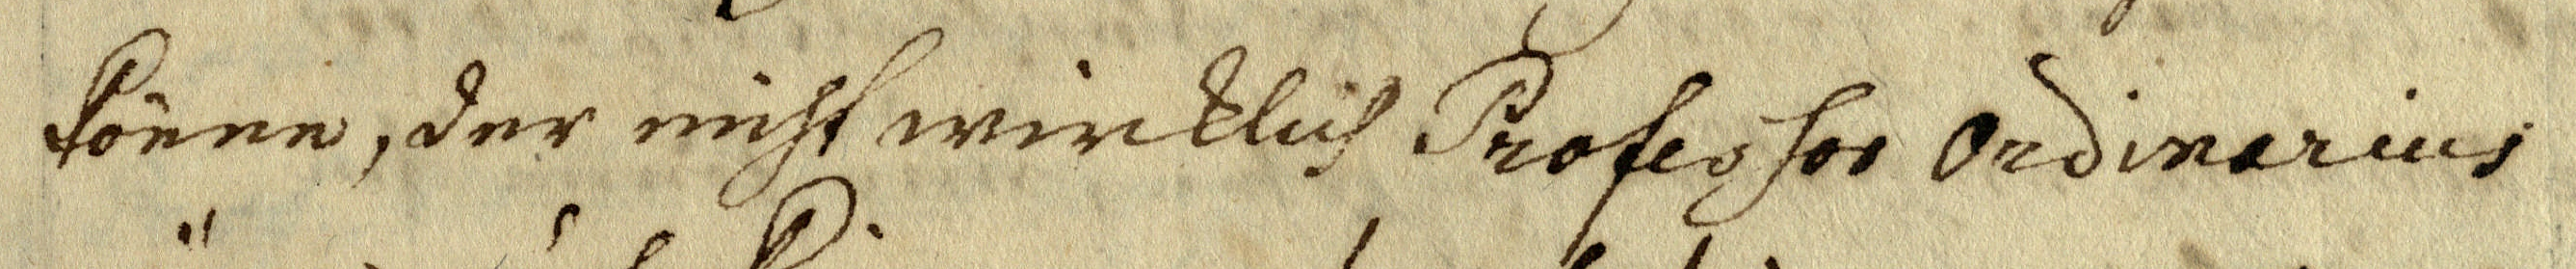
könne, der nicht wirklich Professor Ordinarius
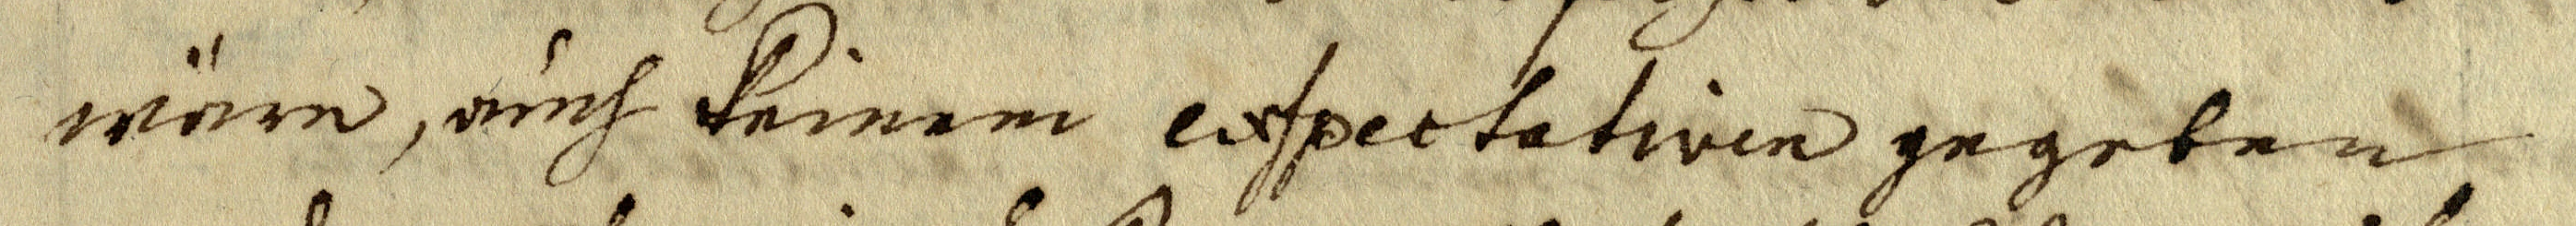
wäre, auch keinem exspectativen gegeben
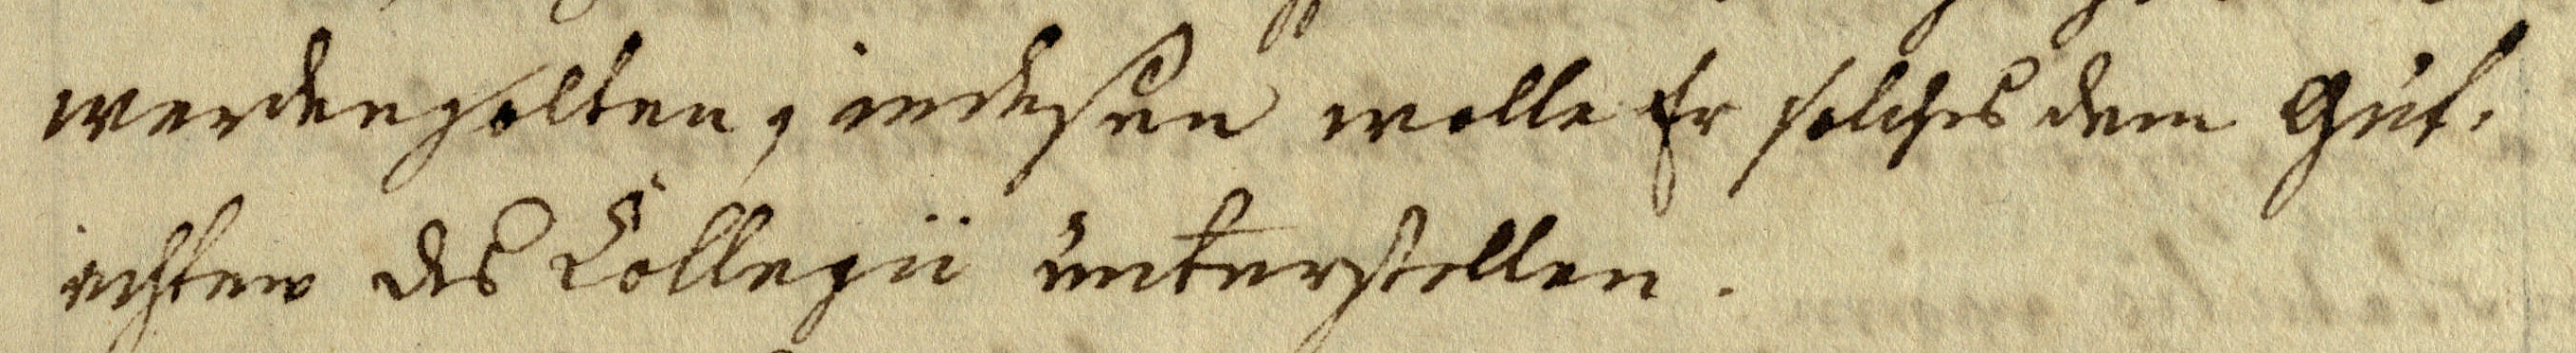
werden solten, indeßen wolte Er solches dem Gut¬
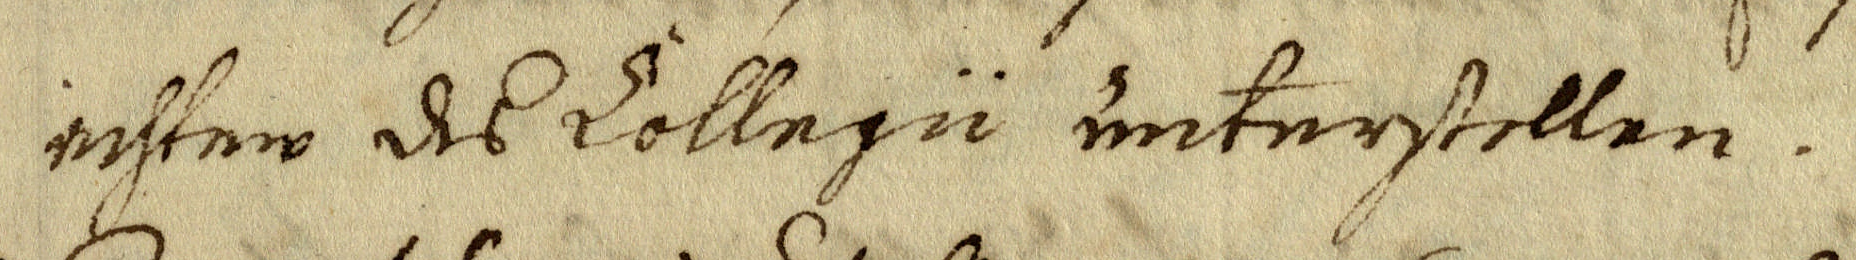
achter des Collegii unterstellen.
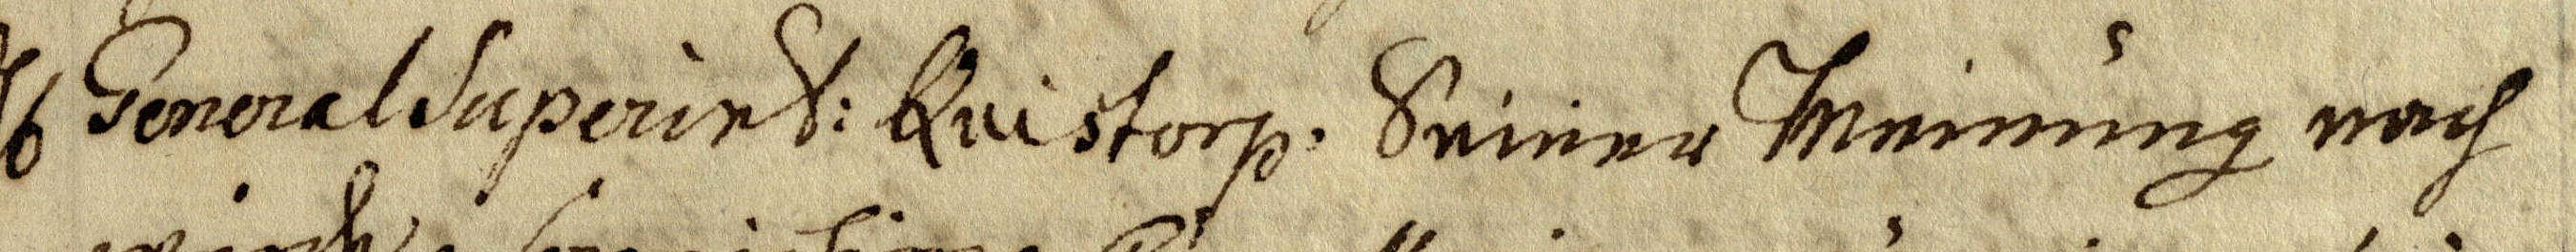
dh GeneralSuperint. Quistorp. Seiner Meinung nach
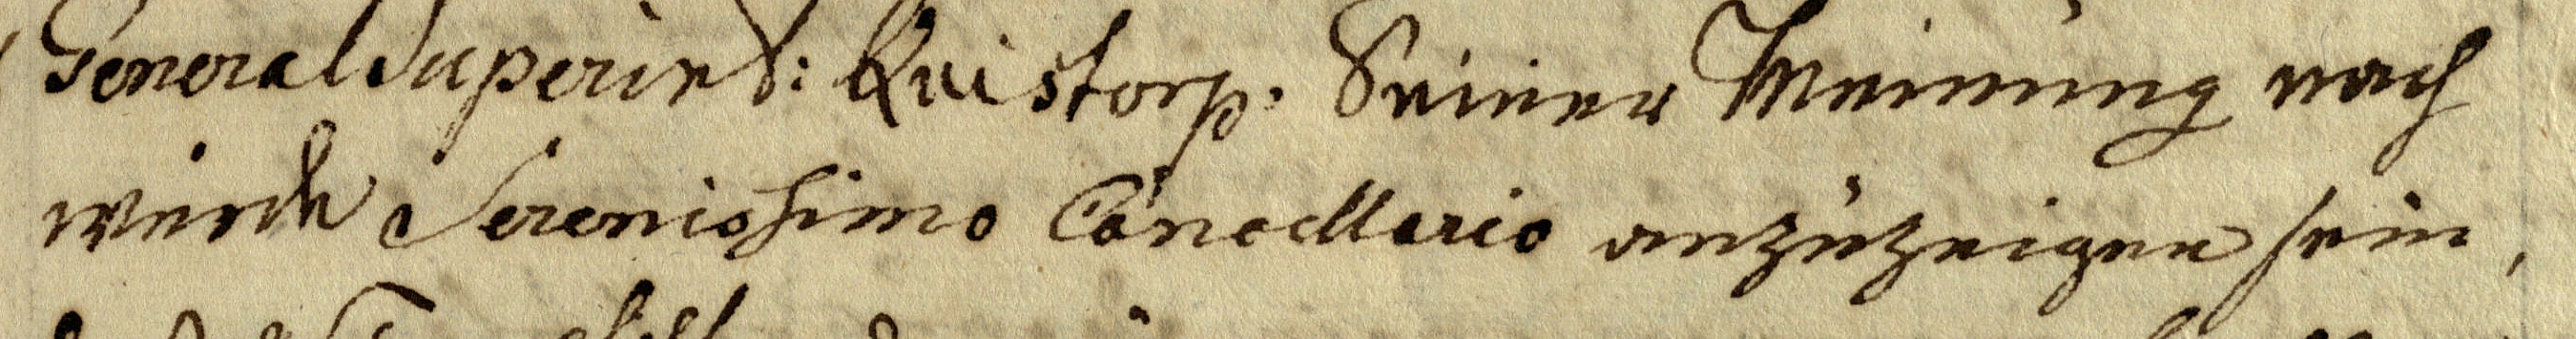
würde Serenissimo Cancellario anzuzeigen sein,
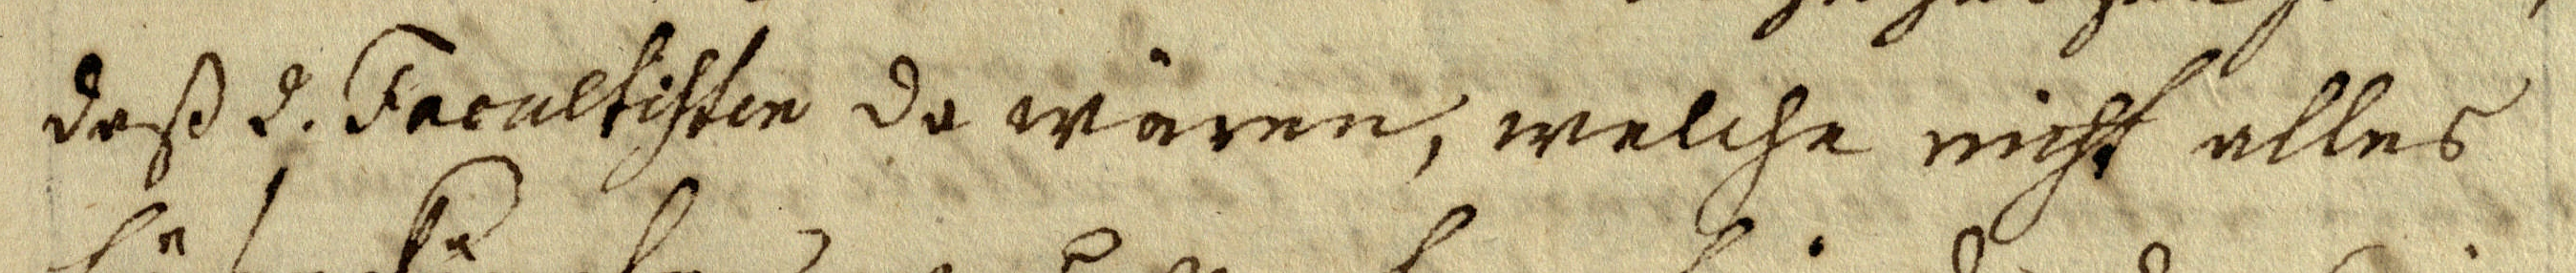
daß 2. Facultisten da wären, welche nicht alles
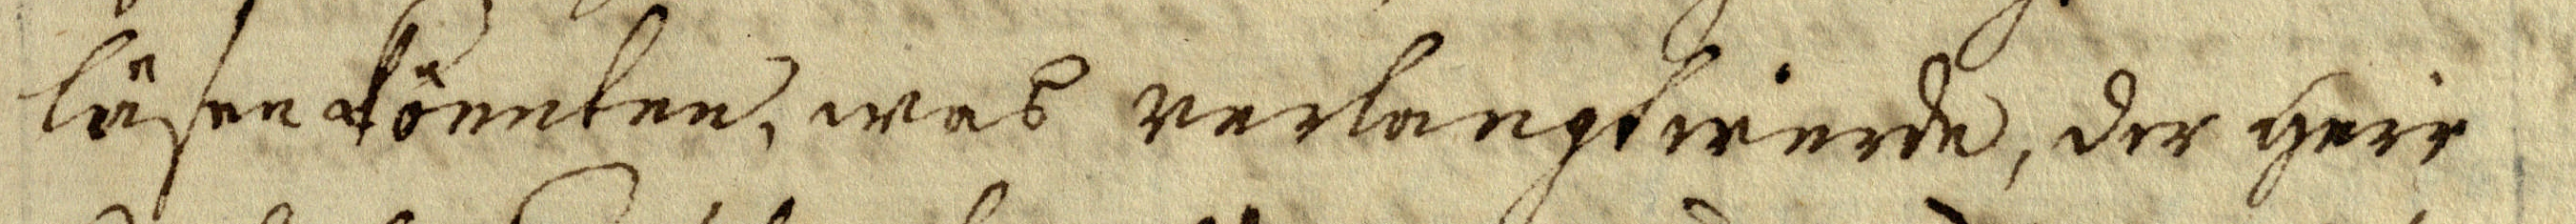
läsen könnten, was verlangt würde, der Herr
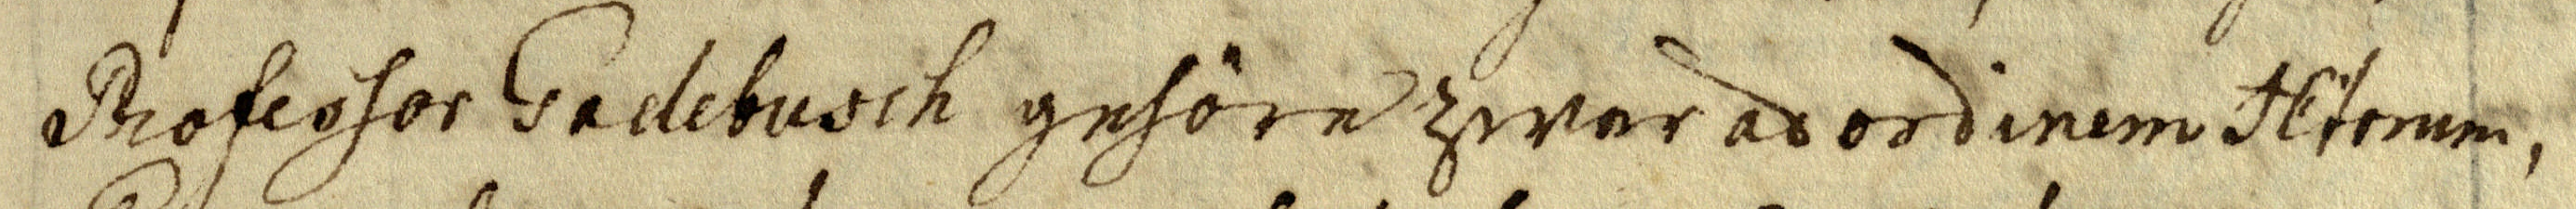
Professor Gadebusch gehöre zwar ad ordinem XXX
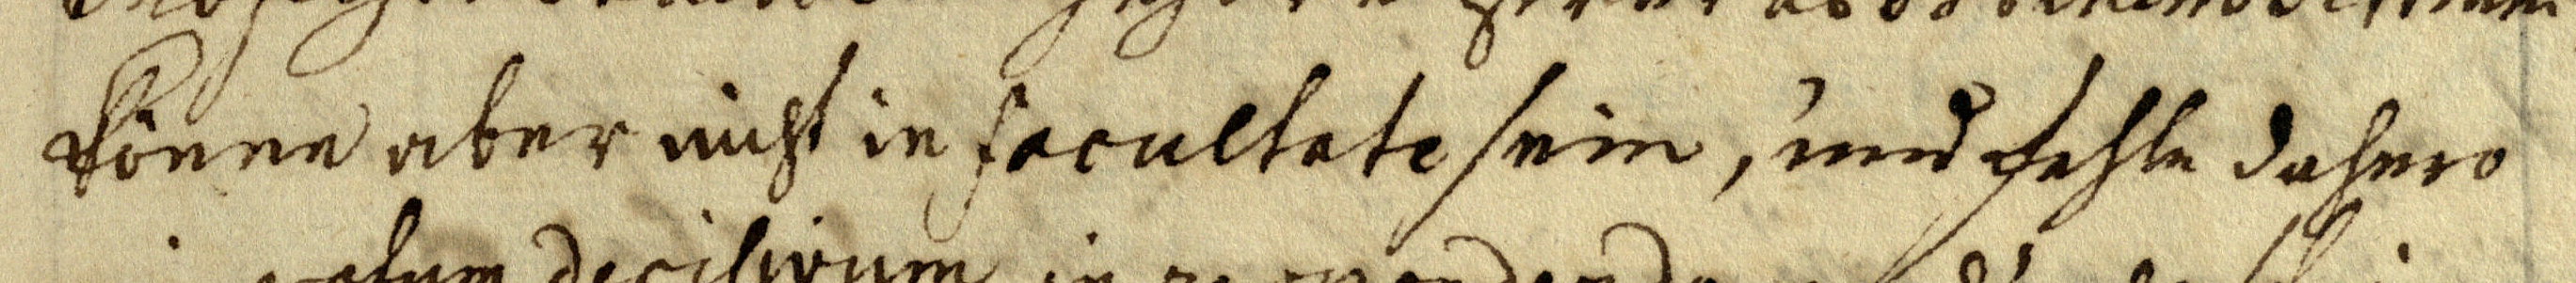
könne aber nicht in facultate sein, und fehle dahero
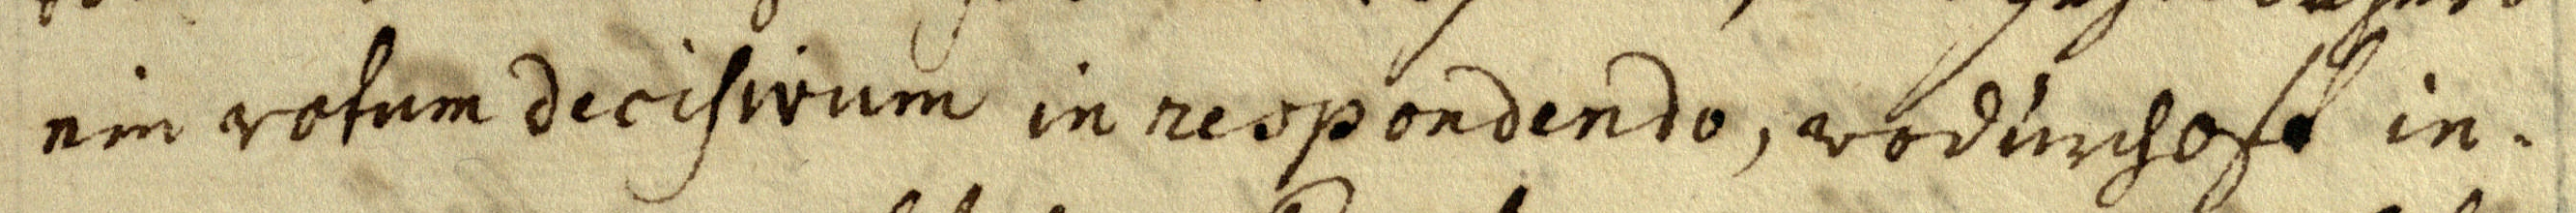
ein votum decisivum in respondendo, wodurch oft in¬
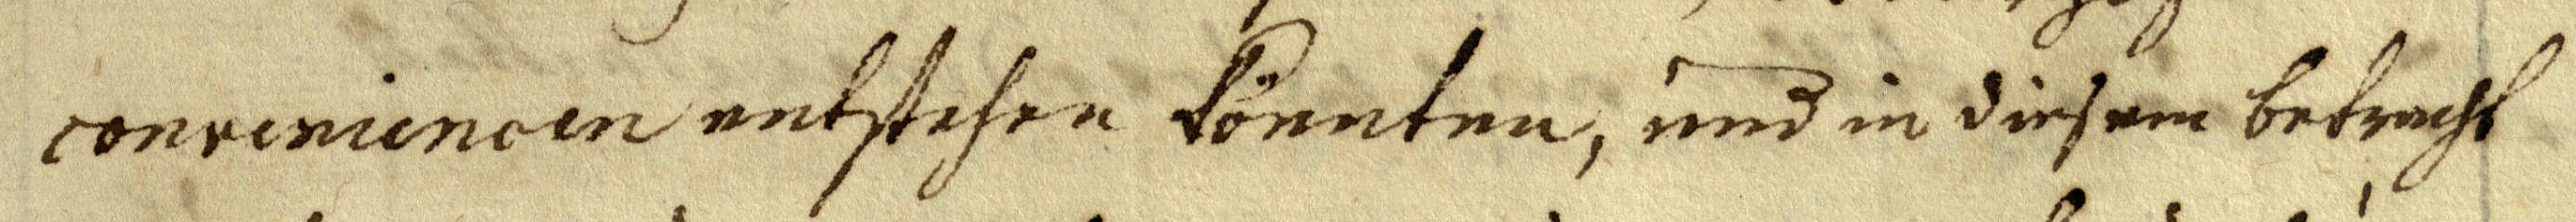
conveniencen entstehen könnten, und in diesem betracht
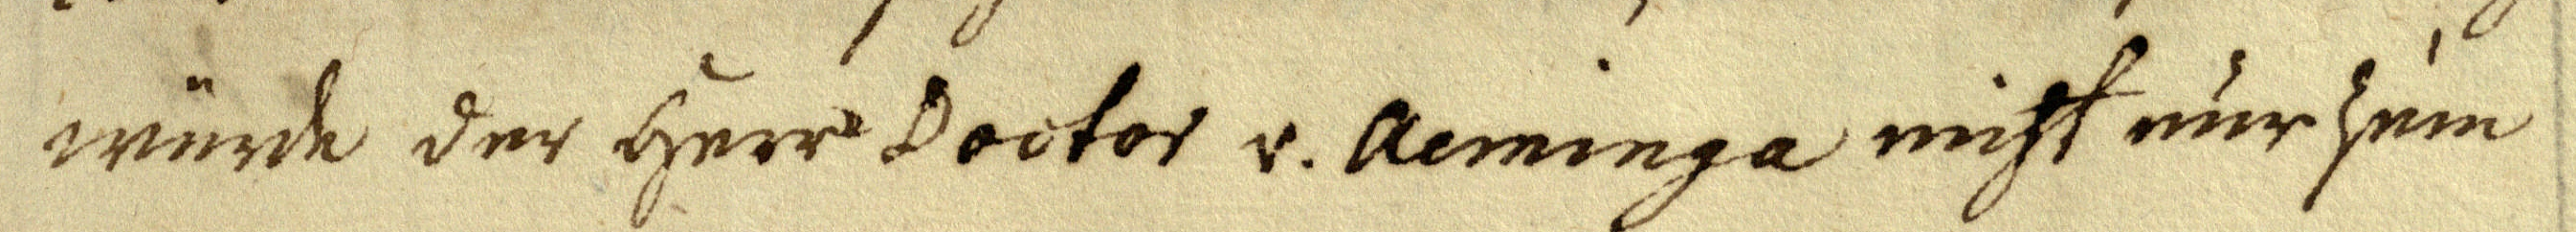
würde der Herr Doctor v. Aeminga nicht nur zum
